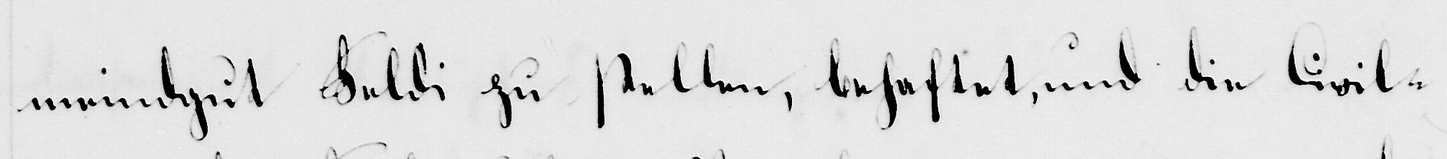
meindgut Feldi zu stellen, behaftet, und die Civil¬
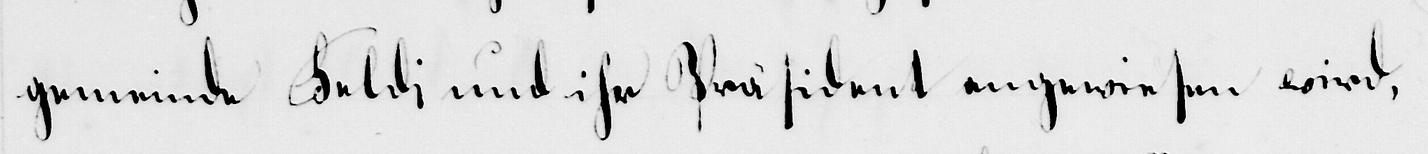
gemeinde Feldi und ihr Präsident angewiesen wird,
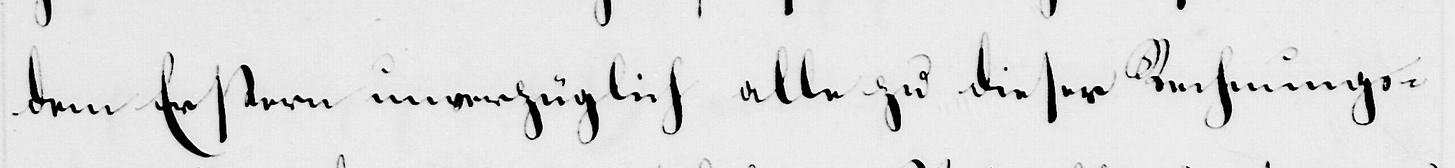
dem Erstern unverzüglich alle zu dieser Rechnungs¬
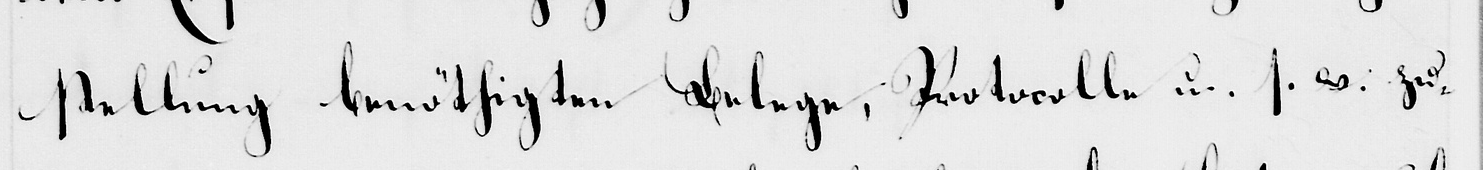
stellung benöthigten Belege, Protocolle u. s. w. zu¬
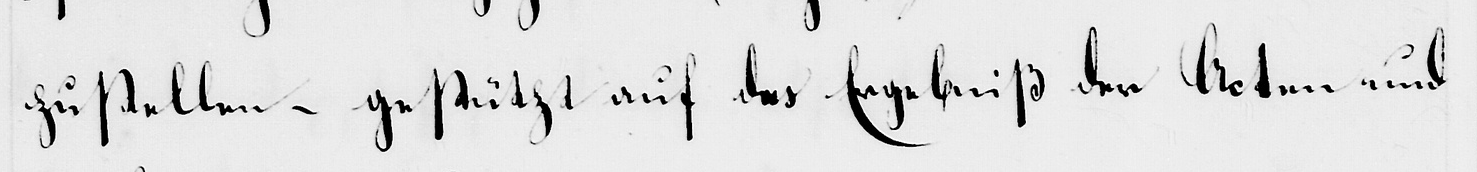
zustellen – gestützt auf das Ergebniß der Acten und
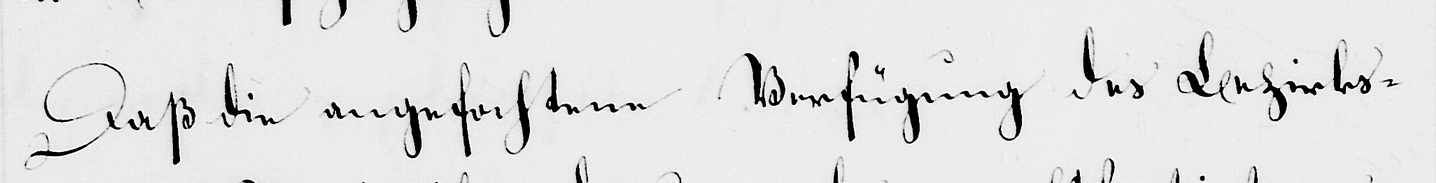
Daß die angefochtene Verfügung des Bezirks¬
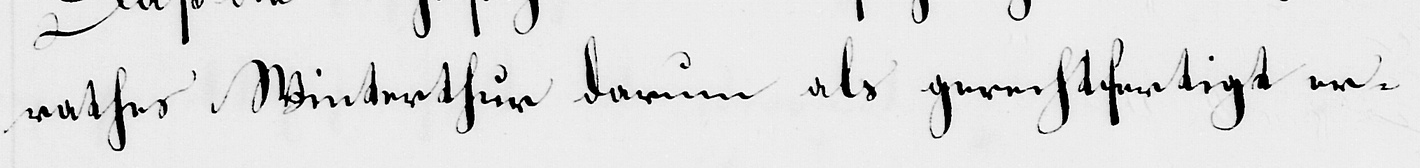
rathes Winterthur darum als gerechtfertigt er¬
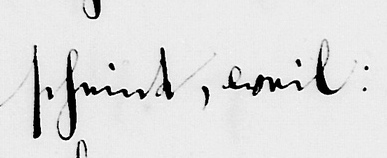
scheint, weil:
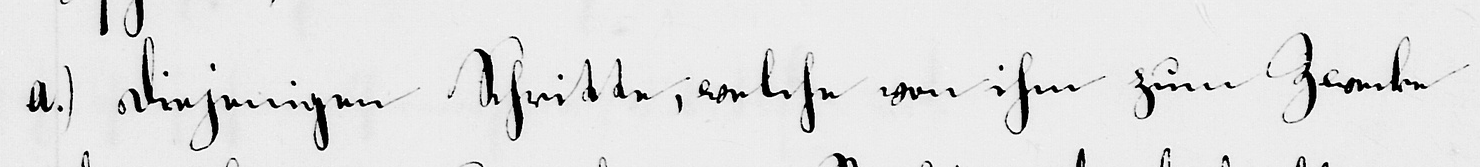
a.) Diejenigen Schritte, welche von ihm zum Zwecke
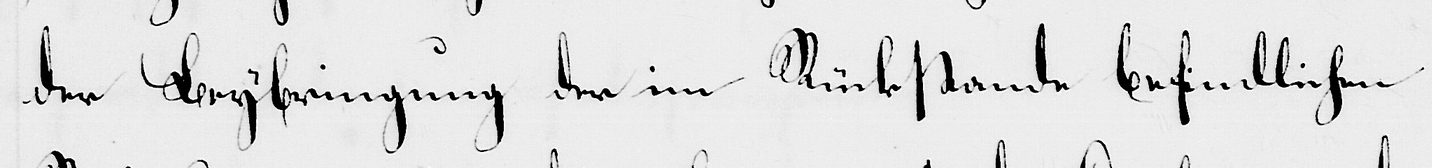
der Beybringung der im Rückstande befindlichen
